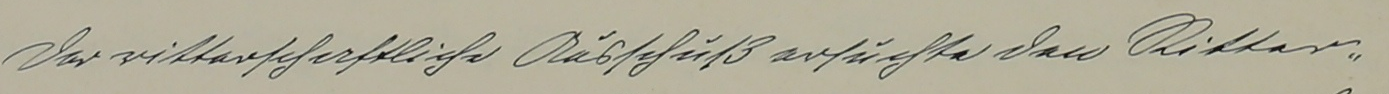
Der ritterschaftliche Ausschuß ersuchte den Ritter-
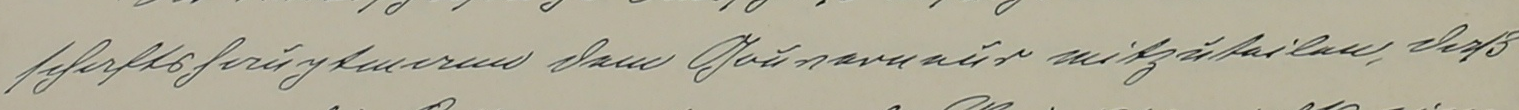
schaftshauptmann dem Gouverneur mitzuteilen, daß
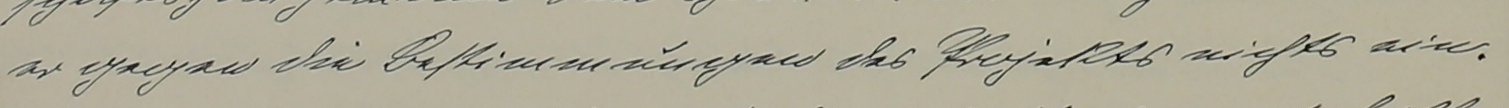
er gegen die Bestimmungen des Projekts nichts ein-
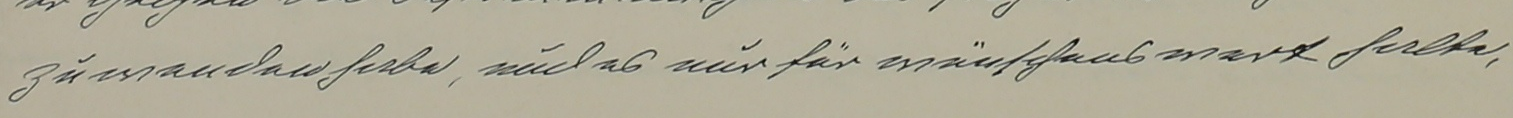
zuwenden habe, und es nur für wünschenswert halte,
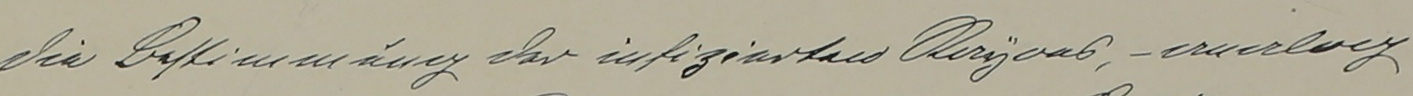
die Bestimmung der infizierten Rayons, – analog
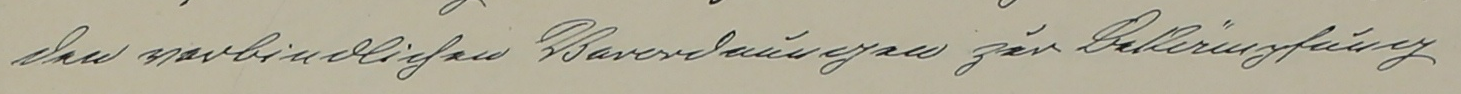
den verbindlichen Verordnungen zur Bekämpfung
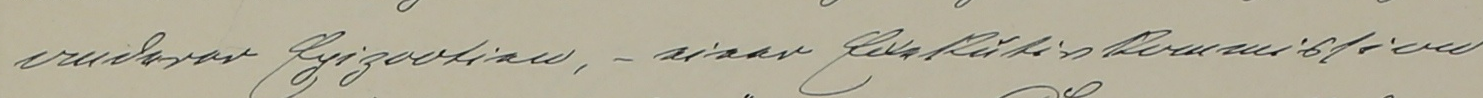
anderer Epizootien, – einer Exekutivkommission
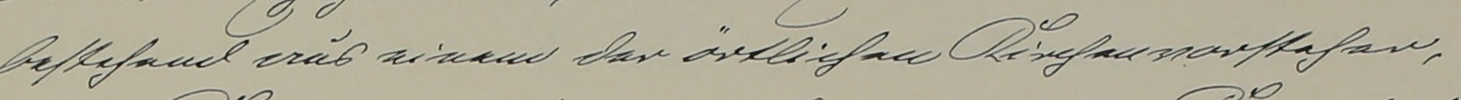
bestehend aus einem der örtlichen Kirchenvorsteher,
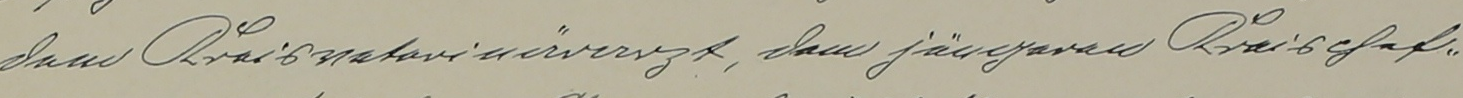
dem Kreisveterinärarzt, dem jüngeren Kreischef-
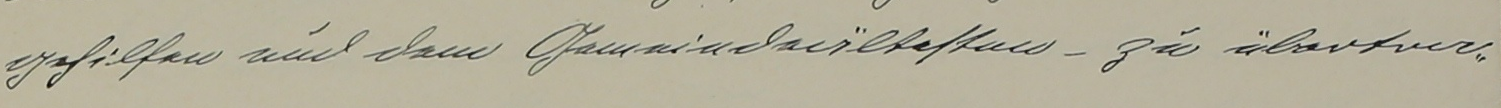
gehilfen und den Gemeindeältesten zu übertra-
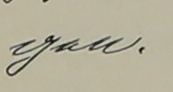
gen.
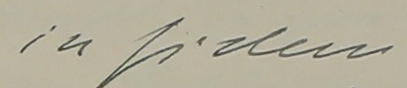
in fidem
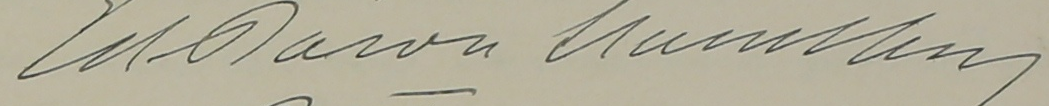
Ed Baron Stackelberg
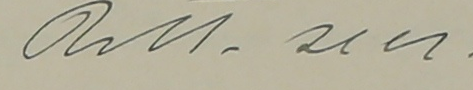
Ritt. secr.
